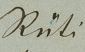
Rüti
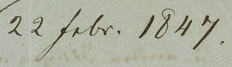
22 Febr. 1847.
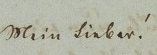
Mein Lieber!
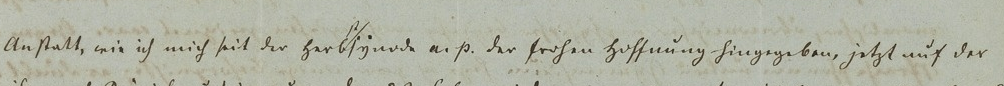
Anstatt, wie ich mich seit der Herbstsynode a. p. der frohen Hoffnung hingegeben, jetzt auf der
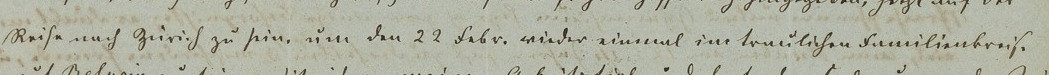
Reise nach Zürich zu sein, um den 22 Febr. wieder einmal im traulichen Familienkreise
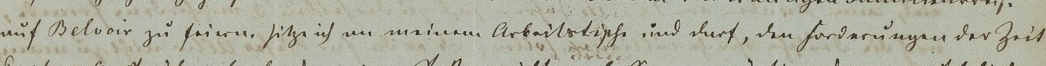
auf Belvoir zu feiern, sitze ich an meinem Arbeitstische und darf, den Forderungen der Zeit
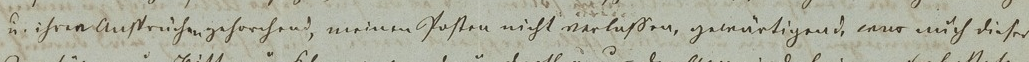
u. ihren Ansprüchen gehorchend, meinen Posten nicht verlassen, gewärtigend, was auch dieser
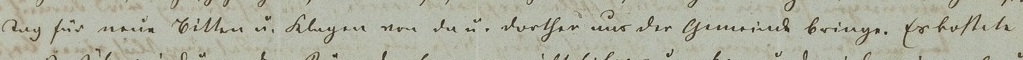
Tag für neue Bitten u. Klagen von da u. dorther aus der Gemeinde bringe. Es kostete
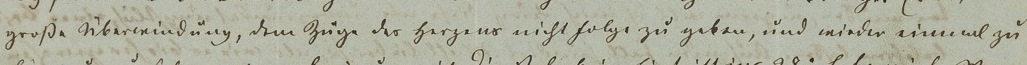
große Überwindung, dem Zuge des Herzens nicht Folge zu geben, und wieder einmal zu
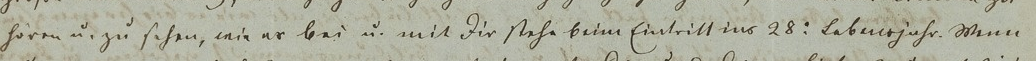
hören u. zu sehen, wie es bei u. mit Dir stehe beim Eintritt ins 28: Lebensjahr. Wenn
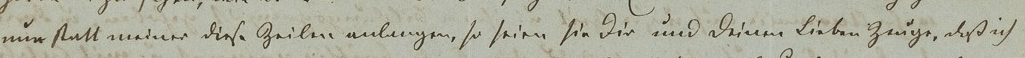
nun statt meiner diese Zeilen anlangen, so seien sie Dir und Deinen Lieben Zeuge, daß ich
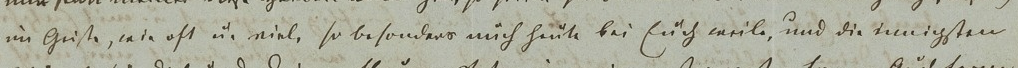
im Geiste, wie oft u. viel, so besonders auch heute bei Euch weile, und die innigsten
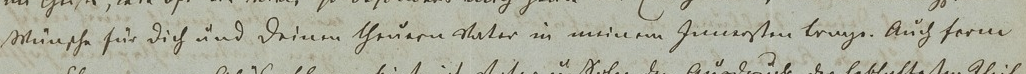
Wünsche für Dich und Deinen theuern Vater in meinem Innersten trage. Auch ferne
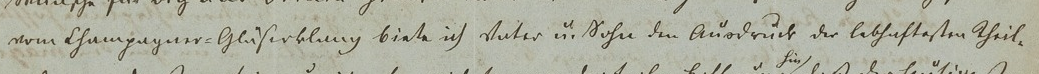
vom Champagner-Gläserklang biete ich Vater u. Sohn den Ausdruck der lebhaftesten Theil-
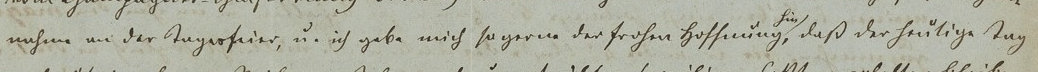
nahme an der Tagesfeier, u. ich gebe mich so gerne der frohen Hoffnung hin, daß der heutige Tag
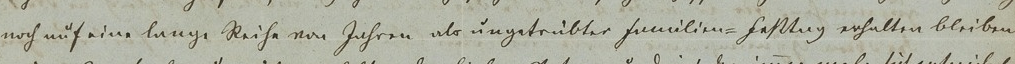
noch auf eine lange Reihe von Jahren als ungetrübter Familien-Festtag erhalten bleiben
